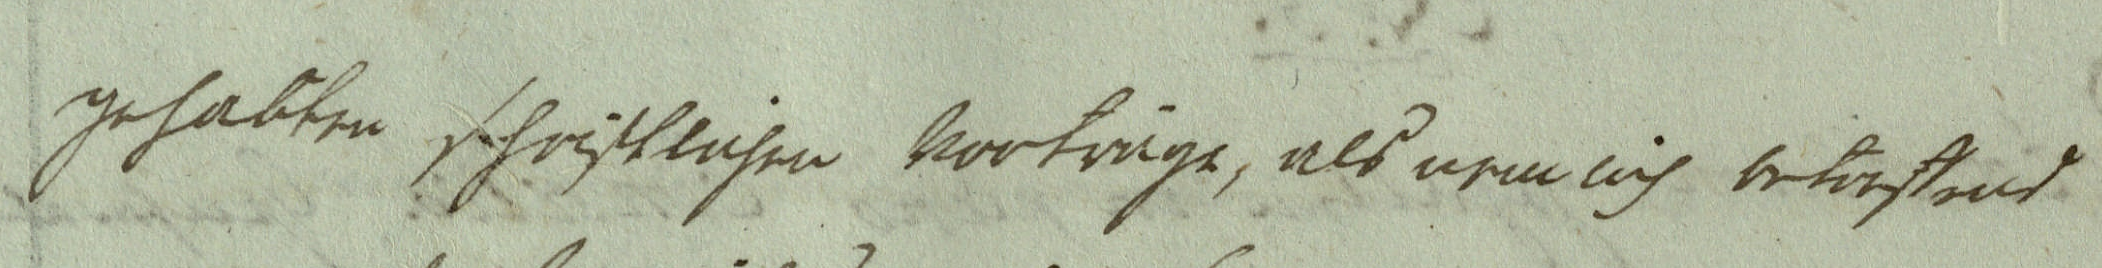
gehabten schriftlichen Vorträge, als nemlich betreffend
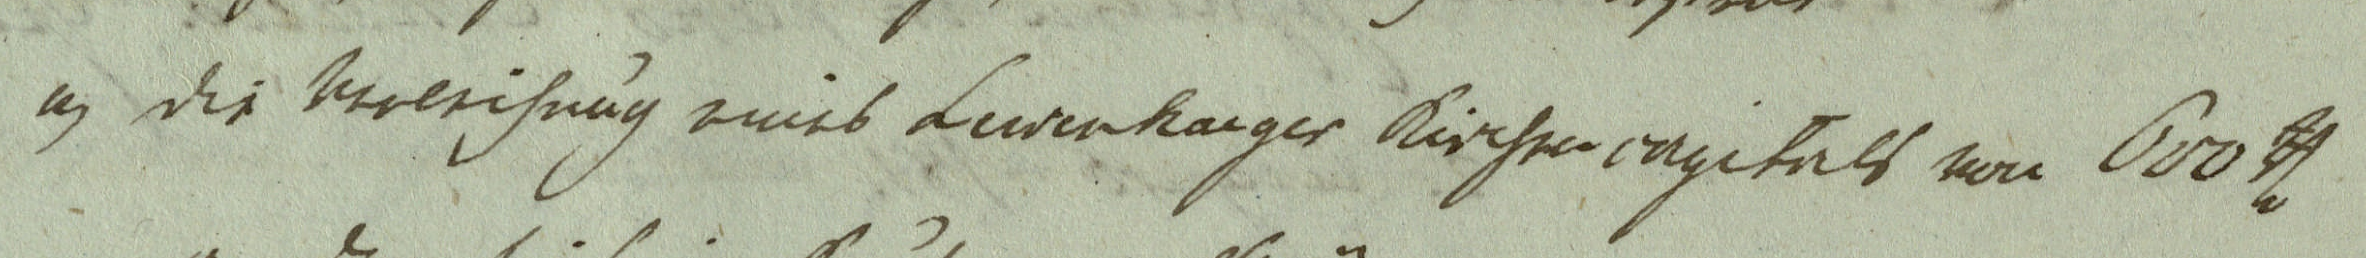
a, die Verleihung eines Lewenhaeger Kirchencapitals von 600 Rt.
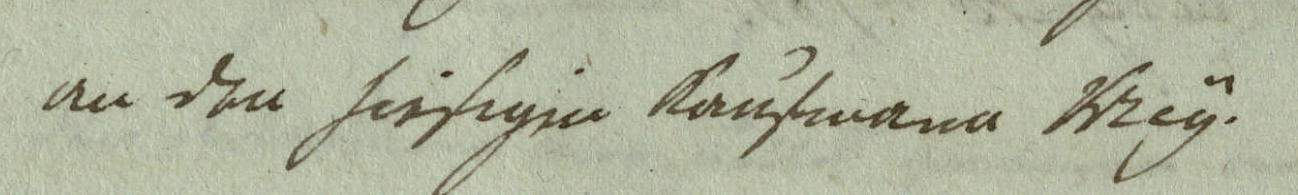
an den hiesigen Kaufmann Kreÿ.
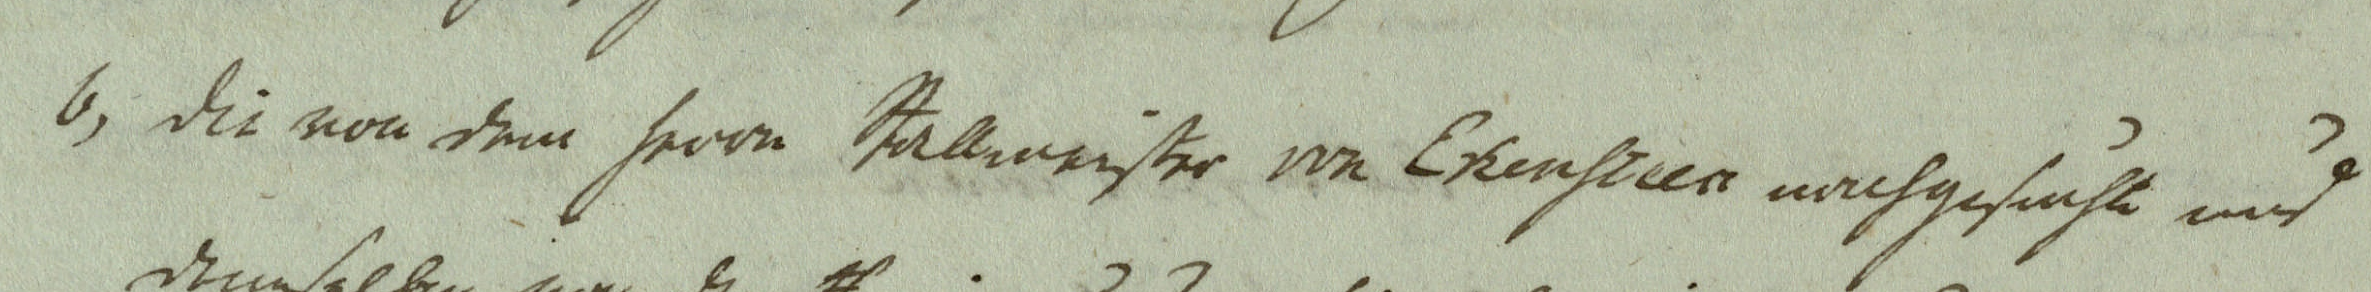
b, die von dem herrn Stallmeister von Ekensteen nachgesuchte und
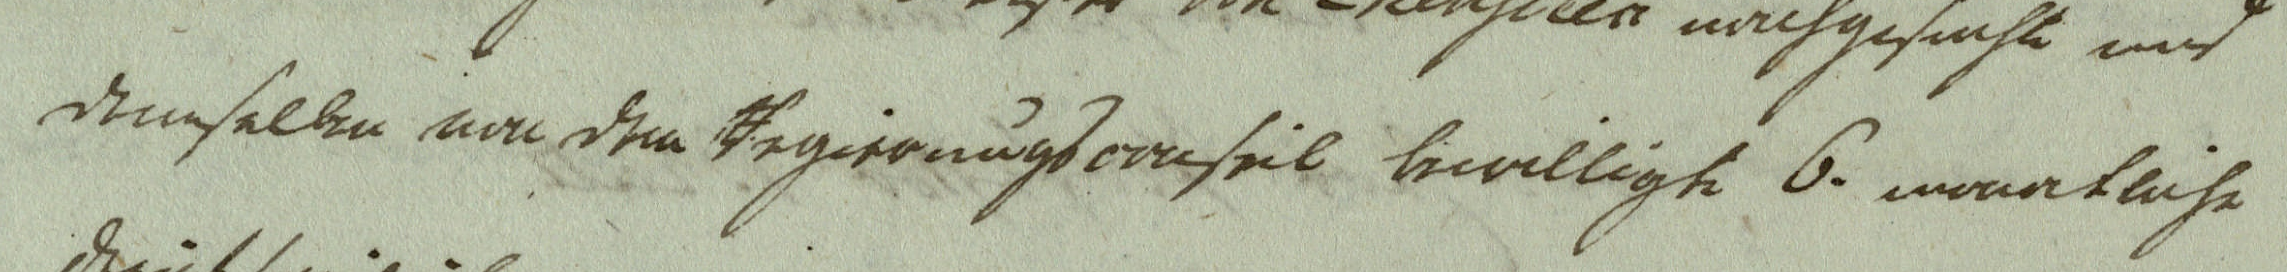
demselben von dem Regierungsconseil bewilligte 6. monatliche
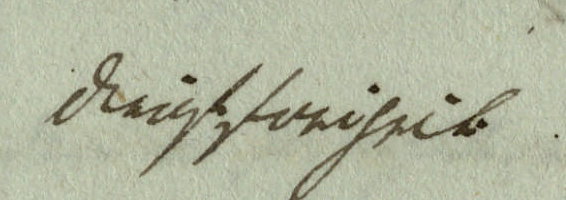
Dienstfreiheit.
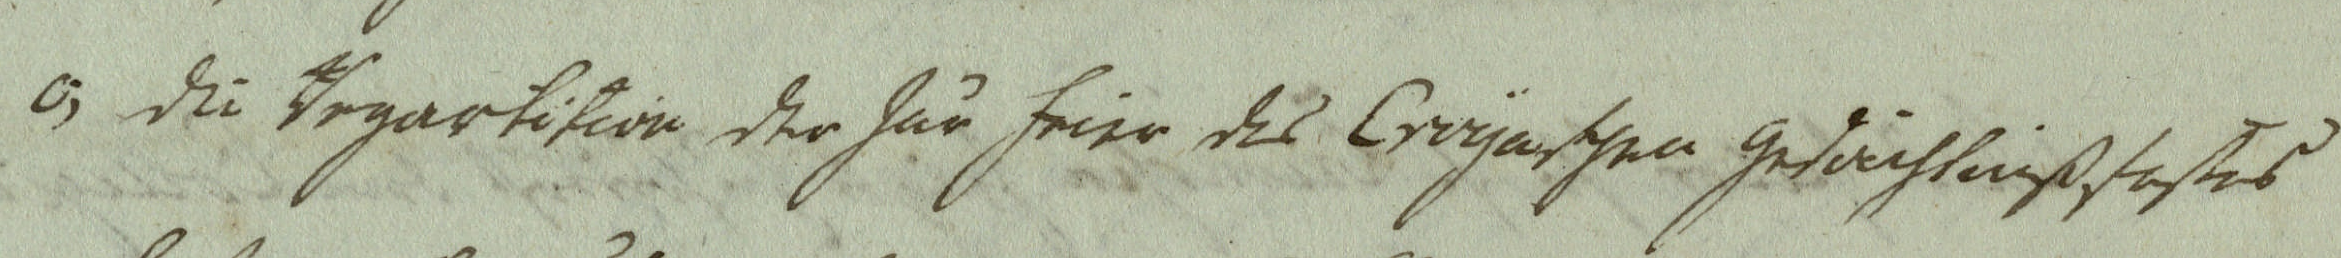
c, die Repartition der zur Feier des Croÿanschen Gedächtnißfestes
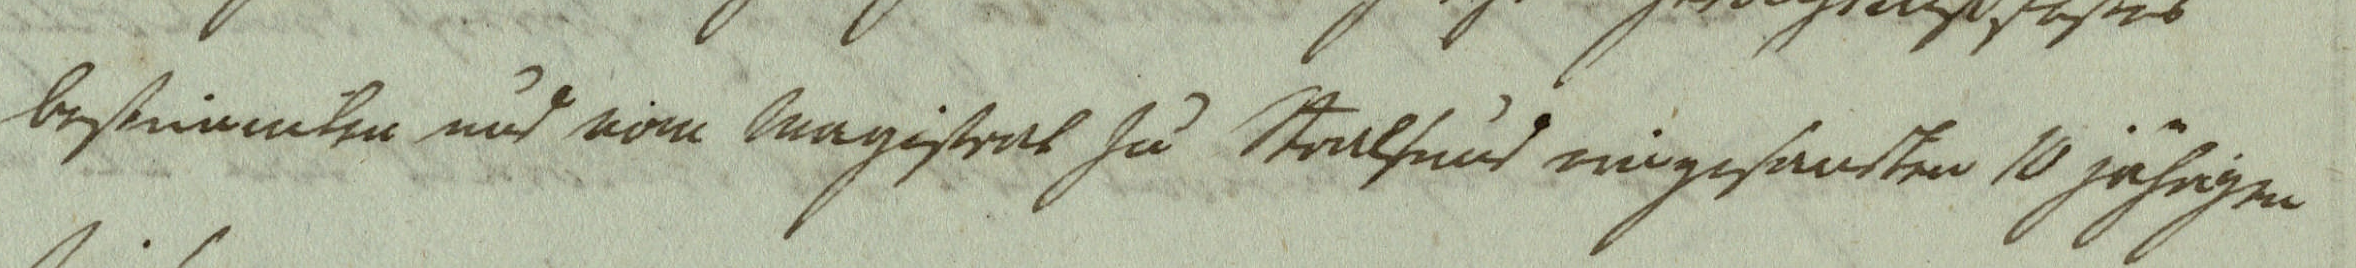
bestimmten und vom Magistrat zu Stralsund eingesandten 10 jährigen
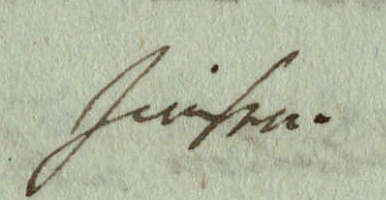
Zinsen.
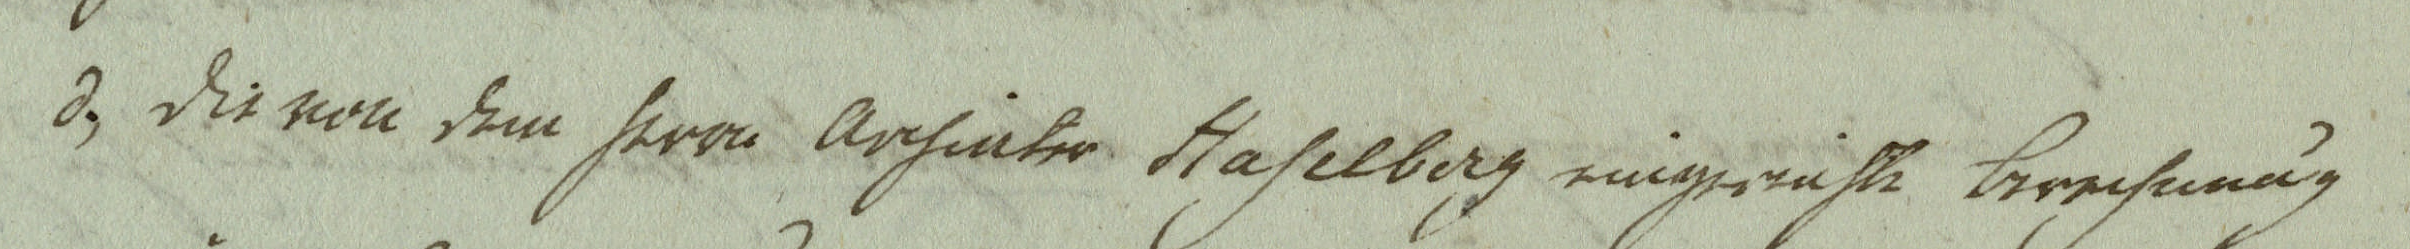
d, die von dem herrn Archiater Haselberg eingereichte Berechnung
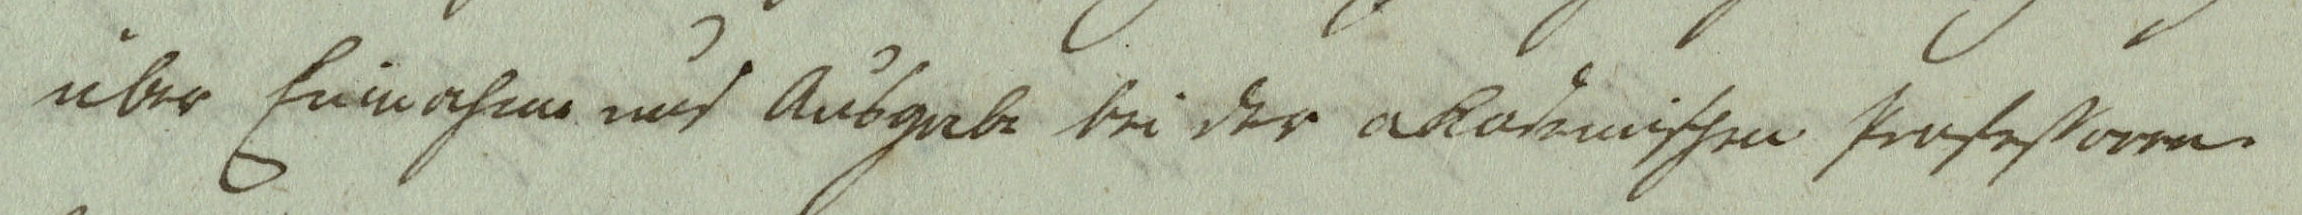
über Einnahme und Ausgabe bei der akademischen Professoren
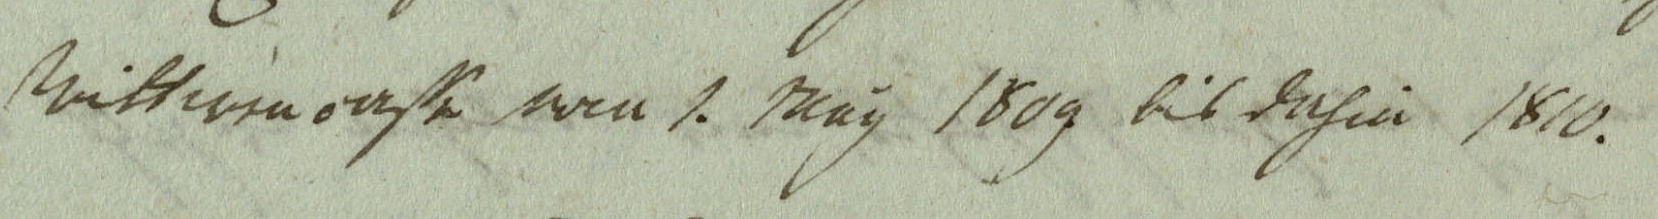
Wittwencasse vom 1. Maÿ 1809 bis dahin 1810.
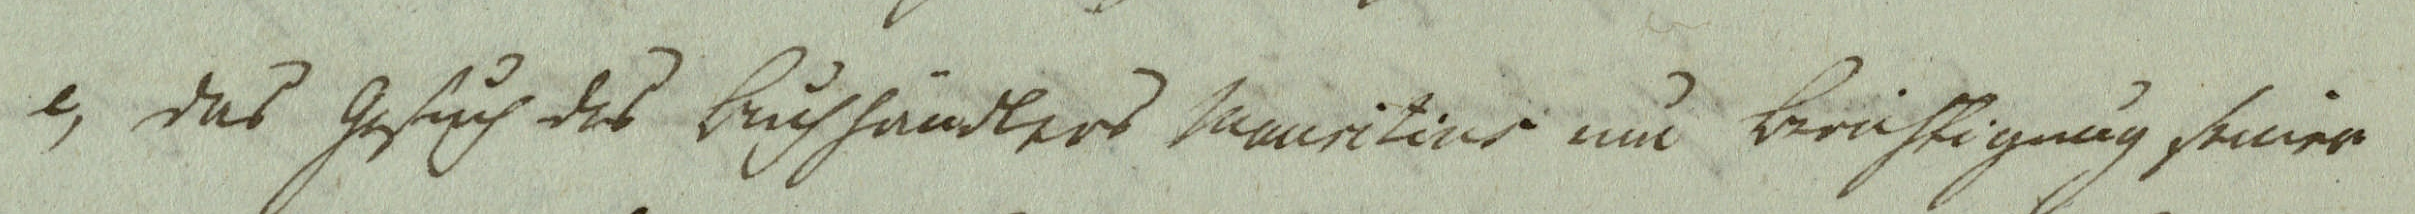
e, das Gesuch des Buchhändlers Mauritius um Berichtigung seiner
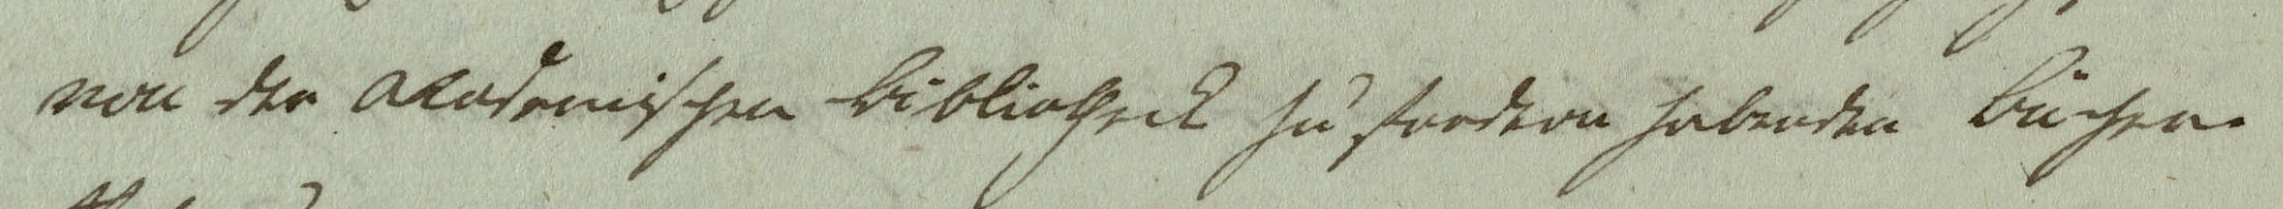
von der akademischen Bibliotheck zu fordern habenden Bücher¬
